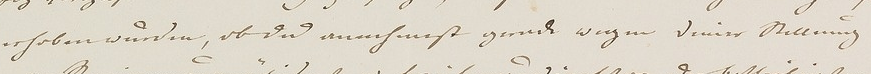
erhoben wurden, ob du annehmest gerade wegen deiner Stellung
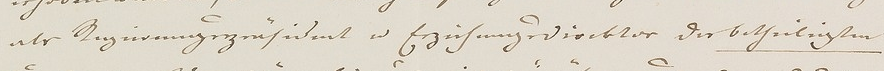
als Regierungspräsident u Erziehungsdirektor des betheiligten
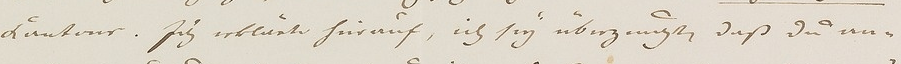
Kantons. Ich erklärte hierauf, ich sey überzeugt, daß du an-
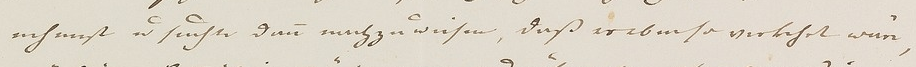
nehmest u suchte dann nachzuweisen, daß es ebenso verkehrt wäre,
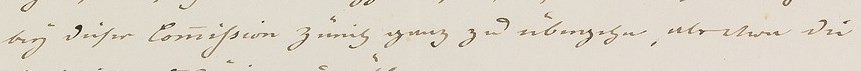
bey dieser Commission Zürich ganz zu übergehen, als etwa die
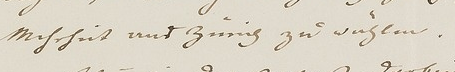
Mehrheit aus Zürich zu wählen.
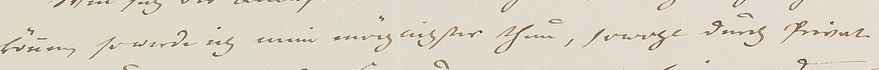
können, so werde ich mein möglichstes thun, sowohl durch Privat-
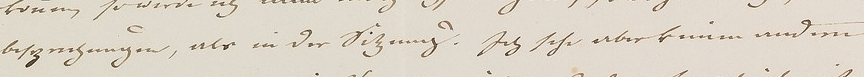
besprechungen, als in der Sitzung. Ich sehe aber keinen andern
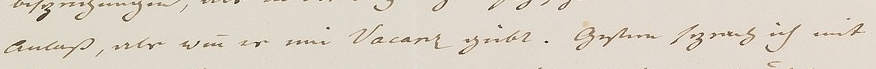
Anlaß, als wenn es eine Vacanz giebt. Gestern sprach ich mit
